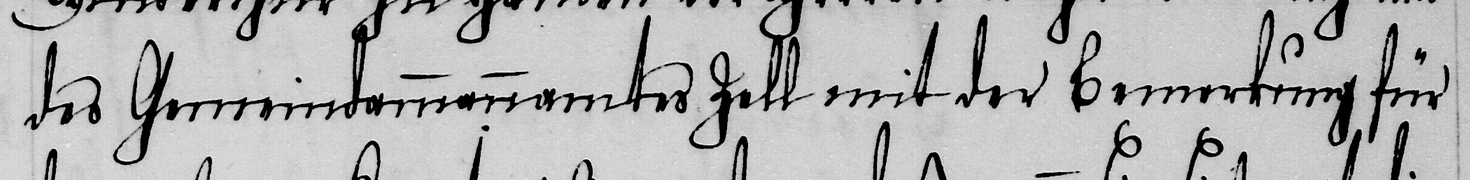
des Gemeindammannamtes Zell mit der Bemerkung für
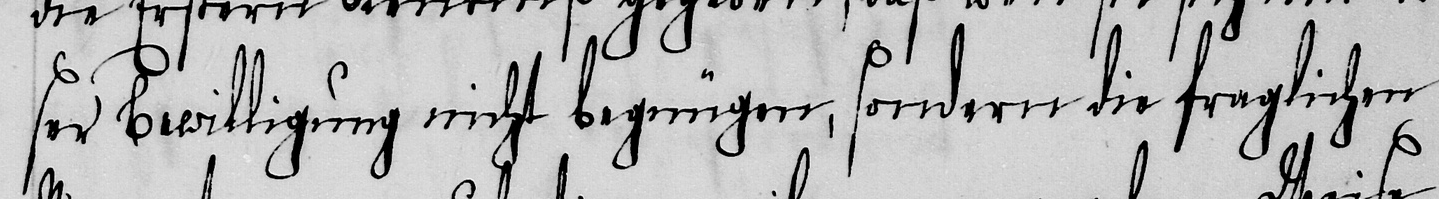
ser Bewilligung nicht begnügen, sondern die fraglichen
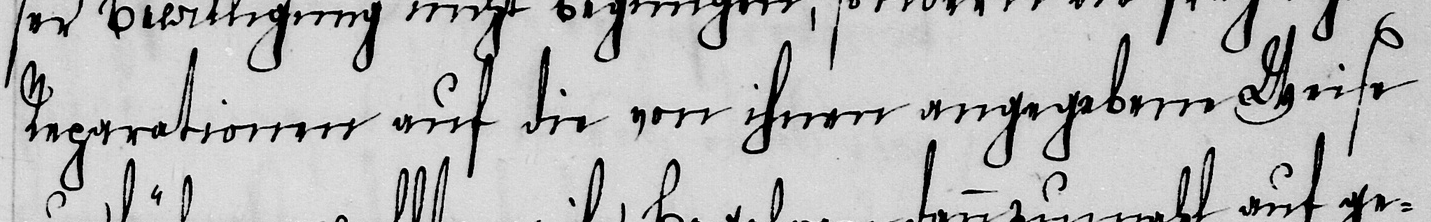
Reparationen auf die von ihnen angegebene Weise
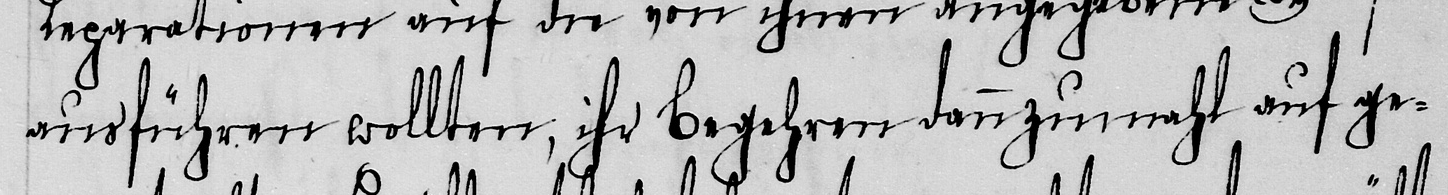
ausführen wollten, ihr Begehren dannzumahl auf ge¬
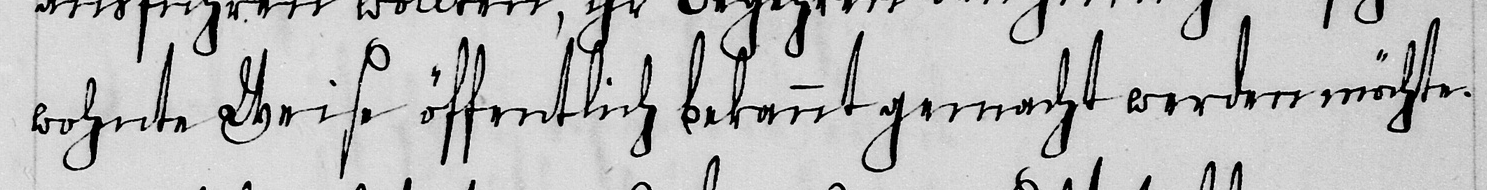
wohnte Weise öffentlich bekannt gemacht werden möchte.
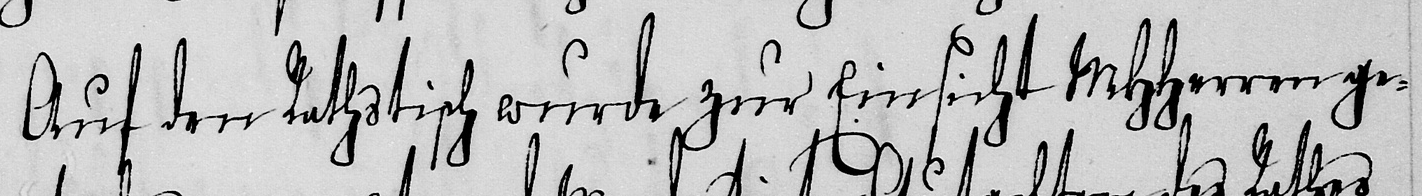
Auf den Rathstisch wurde zur Einsicht MHHerren ge¬
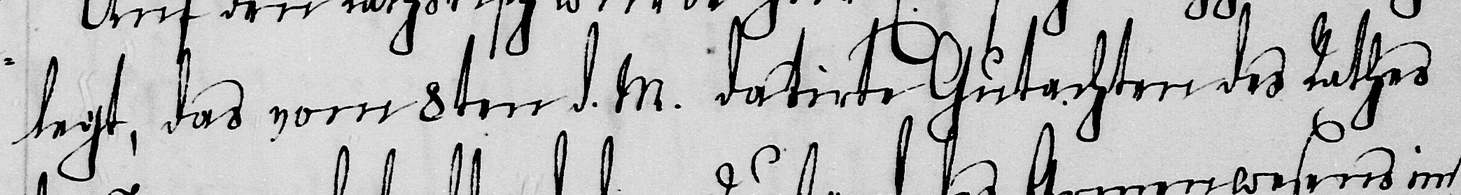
legt, das vom 8ten d. M. datirte Gutachten des Rathes
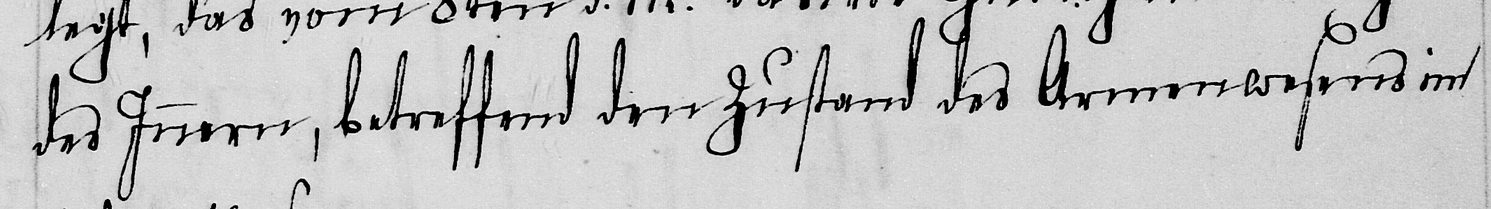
des Innern, betreffend den Zustand des Armenwesens im
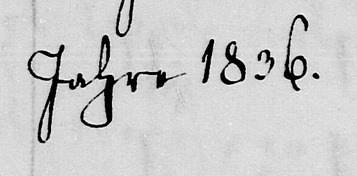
Jahre 1836.
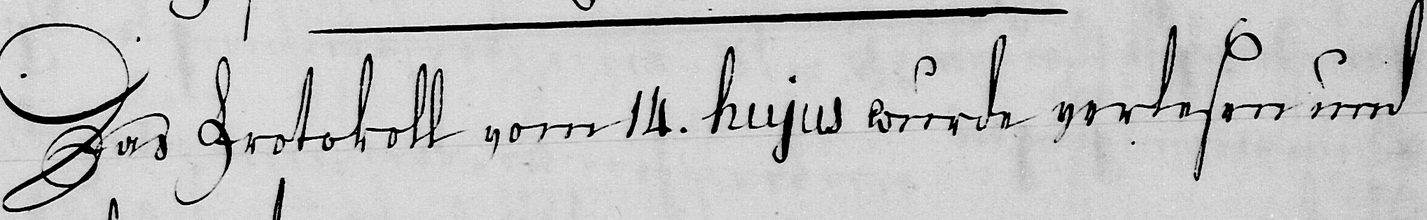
Das Protokoll vom 14. hujus wurde verlesen und
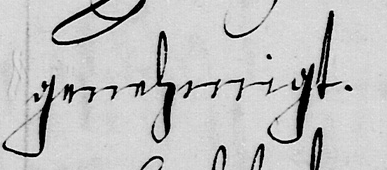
genehmigt.
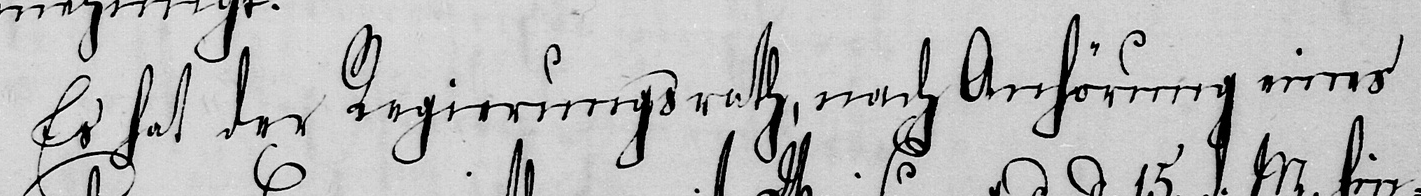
Es hat der Regierungsrath, nach Anhörung eines
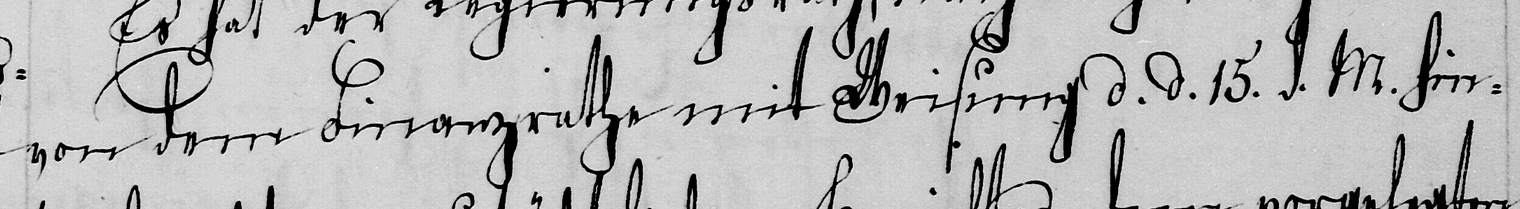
von dem Finanzrathe mit Weisung d. d. 15. d. M. hin¬
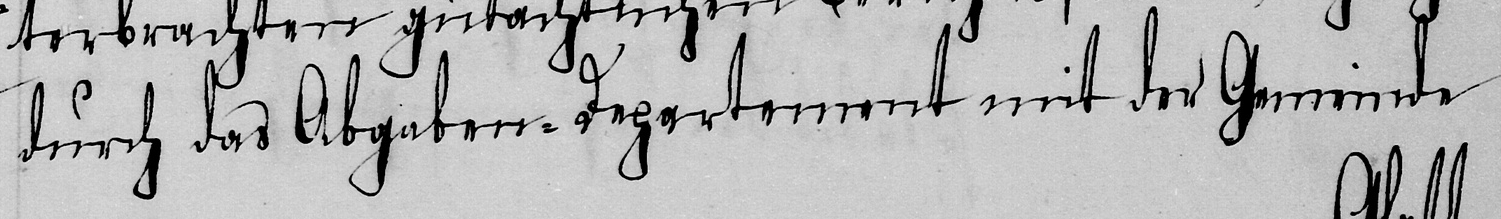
durch das Abgaben-Departement mit der Gemeinde
